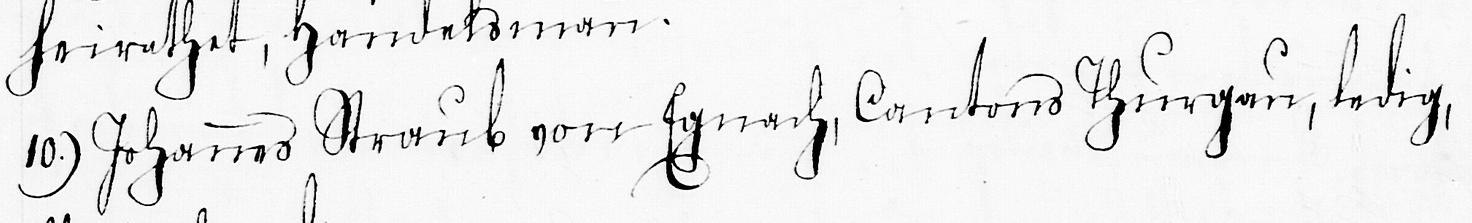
10.) Johannes Straub von Egnach, Cantons Thurgau, ledig,
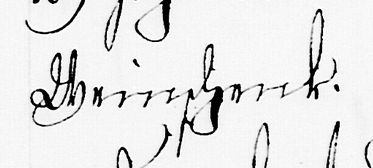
Weinschenk.
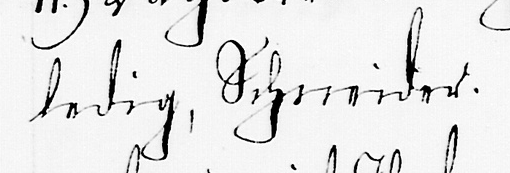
ledig, Schneider.
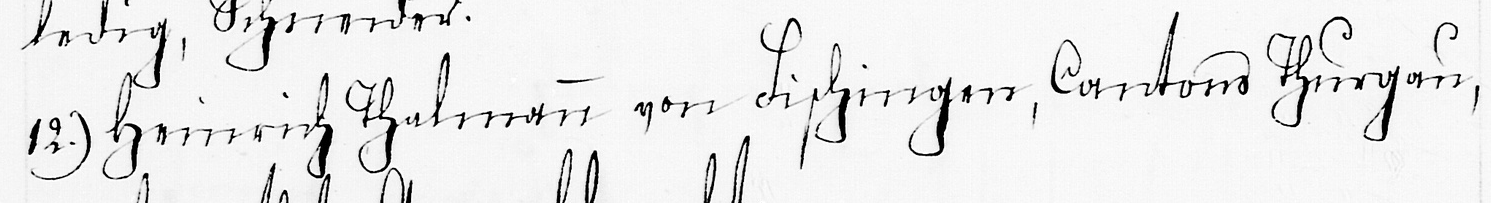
12.) Heinrich Thalmann von Fischingen, Cantons Thurgau,
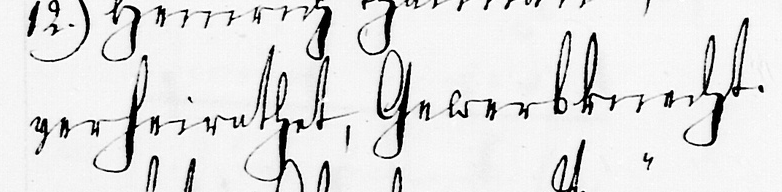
verheirathet, Gewerbknecht.
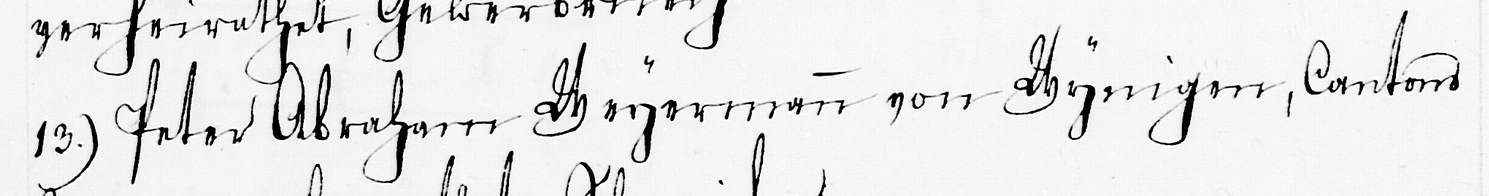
13.) Peter Abraham Weyermann von Wynigen, Cantons
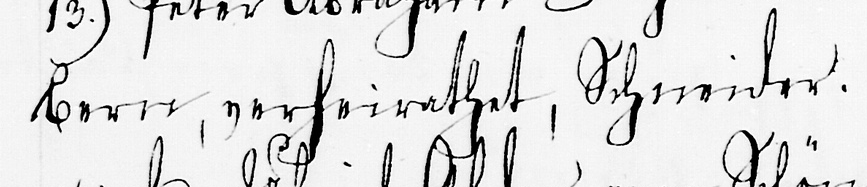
Bern, verheirathet, Schneider.
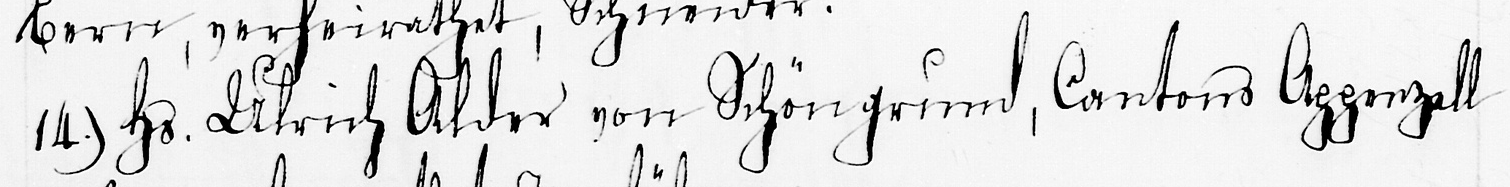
14.) Hs. Ulrich Alder von Schöngrund, Cantons Appenzell
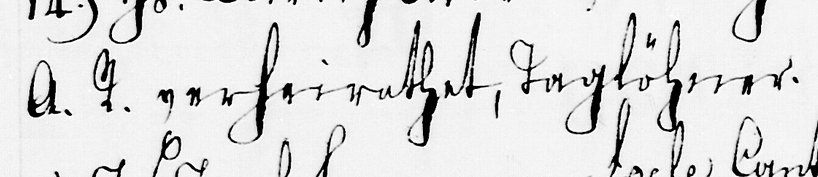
A. R. verheirathet, Taglöhner.
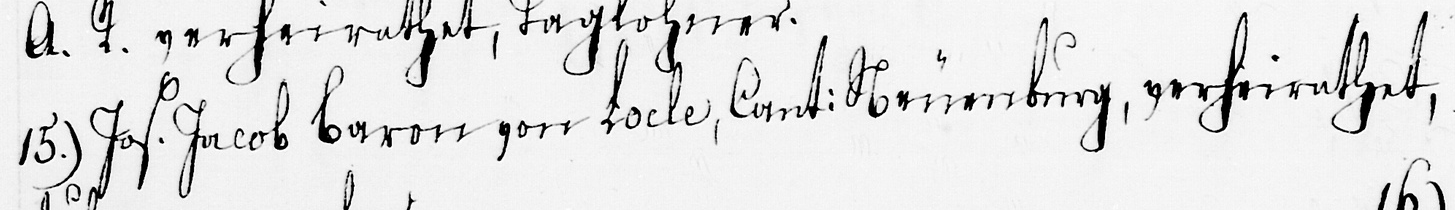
15.) Jos. Jacob Baron von Locle, Cant: Neuenburg, verheirathet,
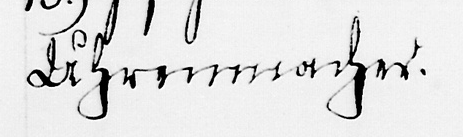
Uhrenmacher.
